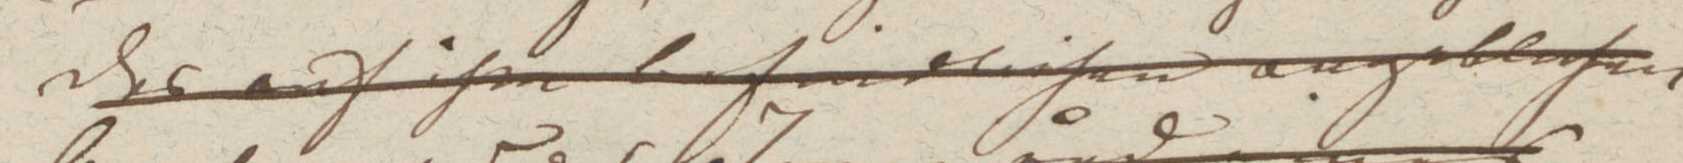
des auf ihm befindlichen angeblichen
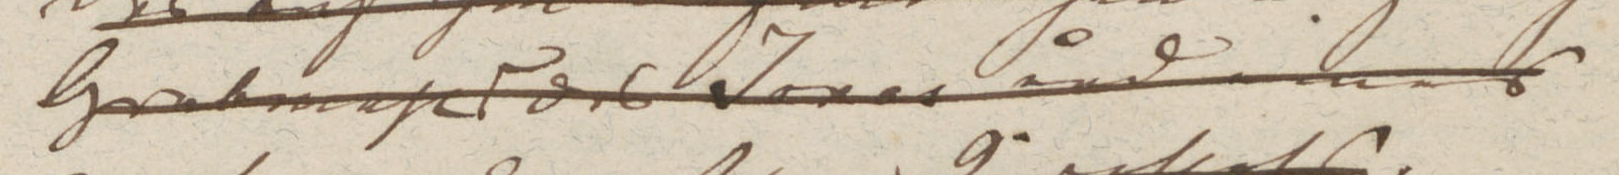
Grabmahls des und eines
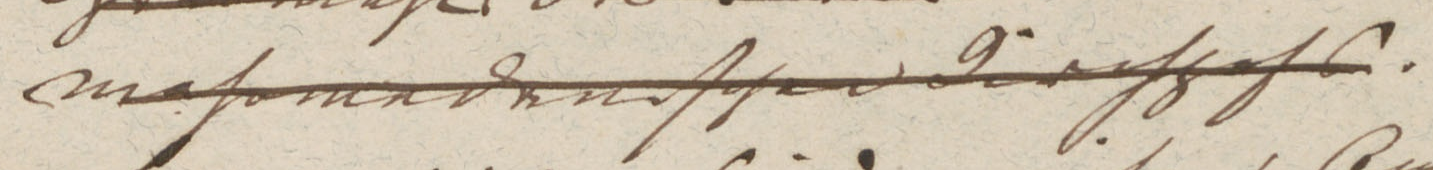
mahomedanischen Kirchhofs.
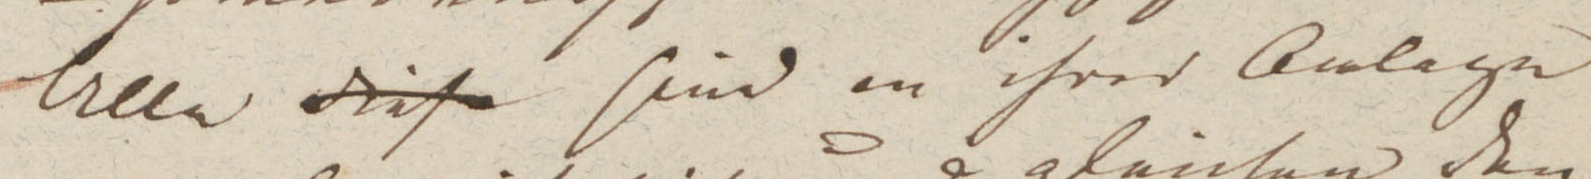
Alle diese sind in ihrer Anlage
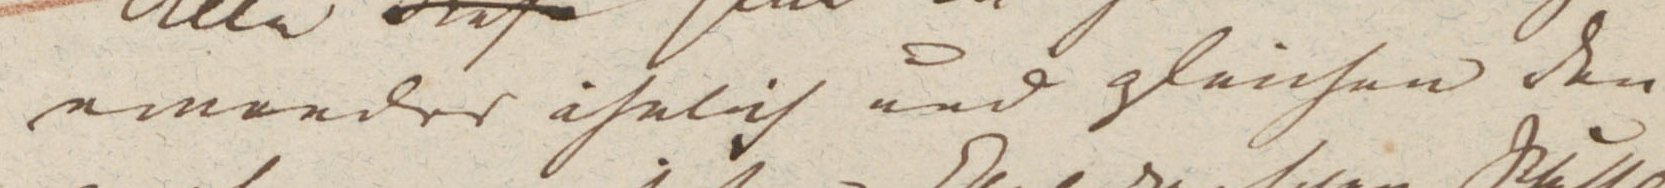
einander ähnlich und gleichen den
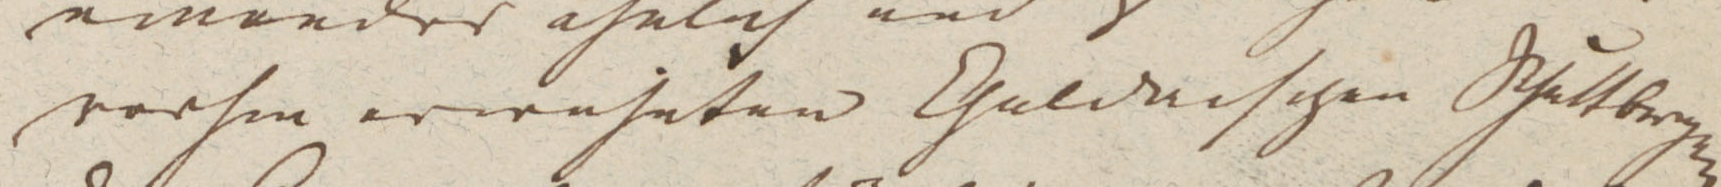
vorhin erwähnten Chaldaischen Schuttbergen
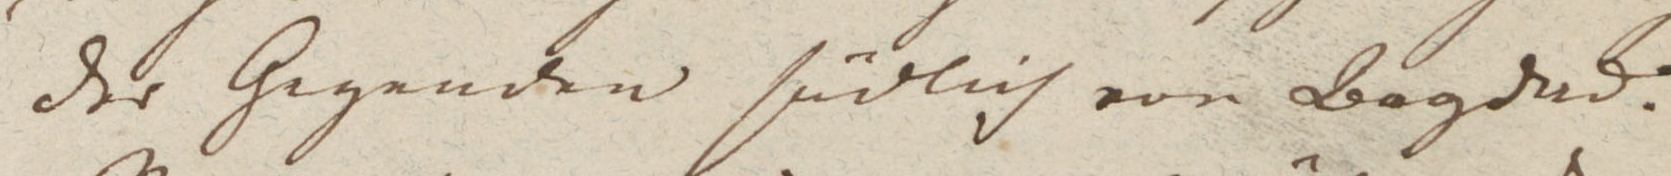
der Gegenden südlich von Bagdad.
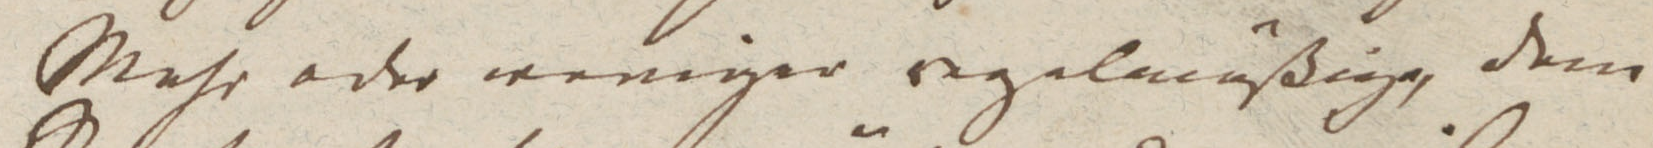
Mehr oder weniger regelmässige, dem
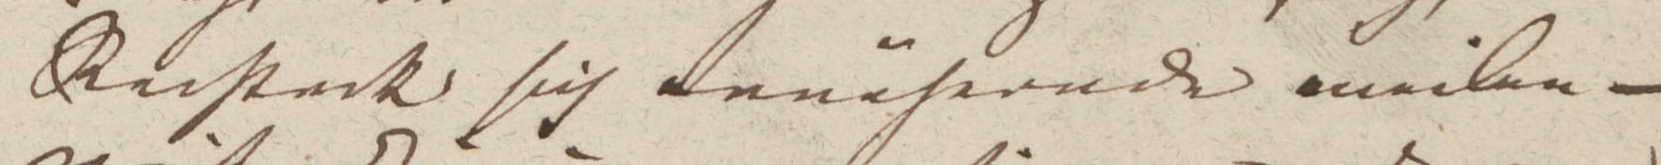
Rechteck sich annähernde meilen-
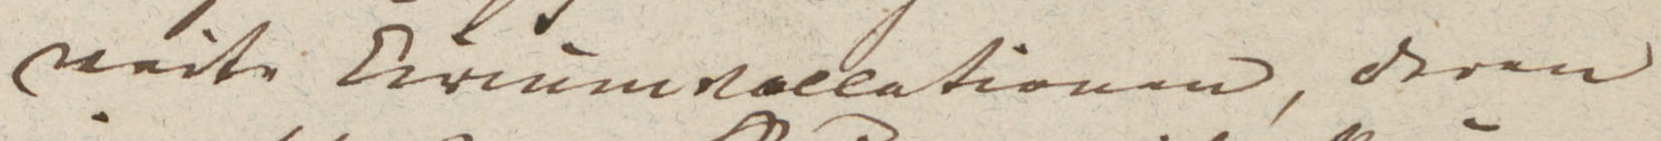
weite Circumvallationen, deren
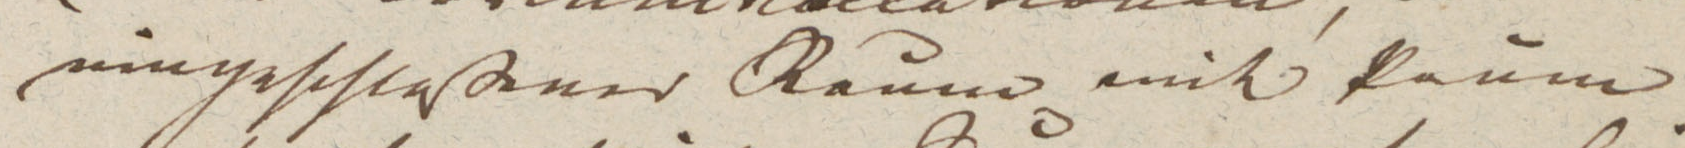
eingeschlossener Raum mit kaum
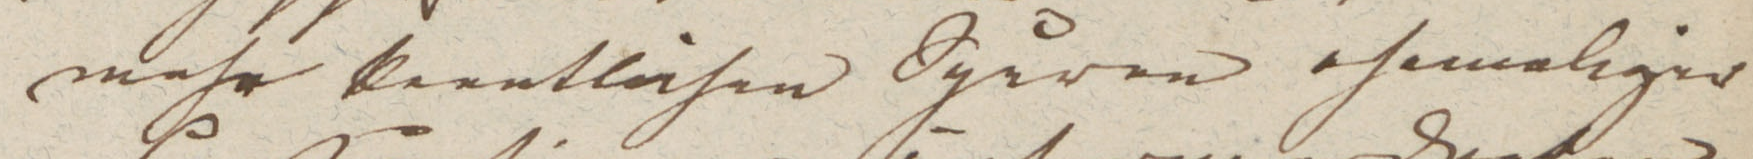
mehr kenntlichen Spuren ehemaliger
